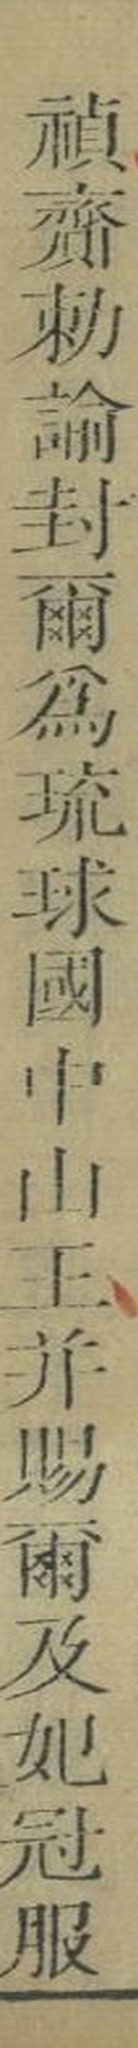禎齎勅諭封爾為琉球国中山王并賜爾及妃冠服
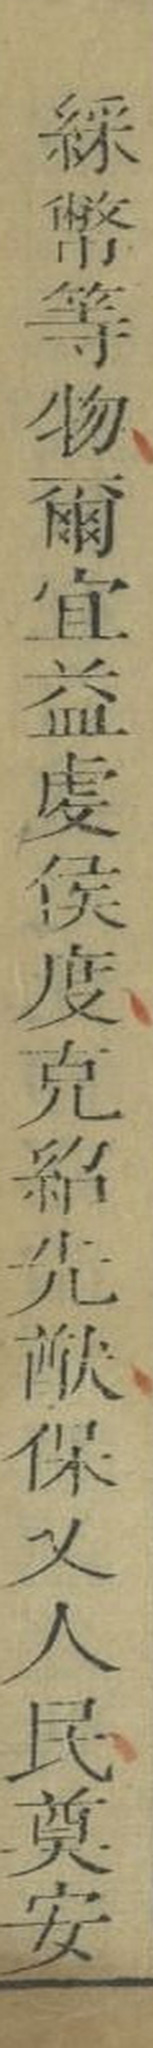綵幣等物爾宜益虔侯度克紹先猷保乂人民奠安

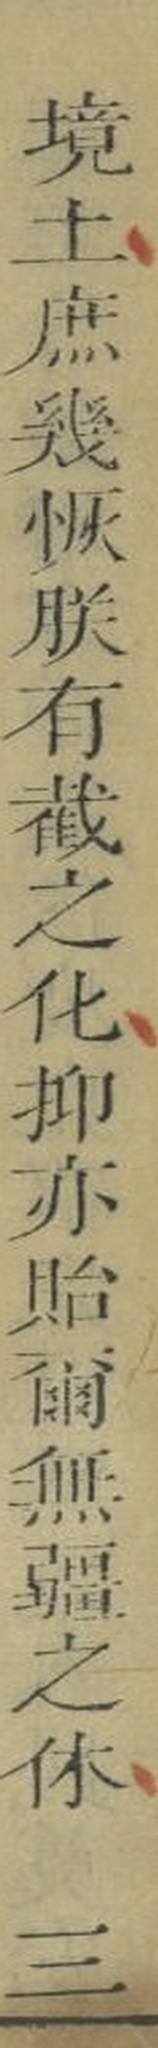境土庶幾恢朕有截之化抑亦貽爾無疆之休三
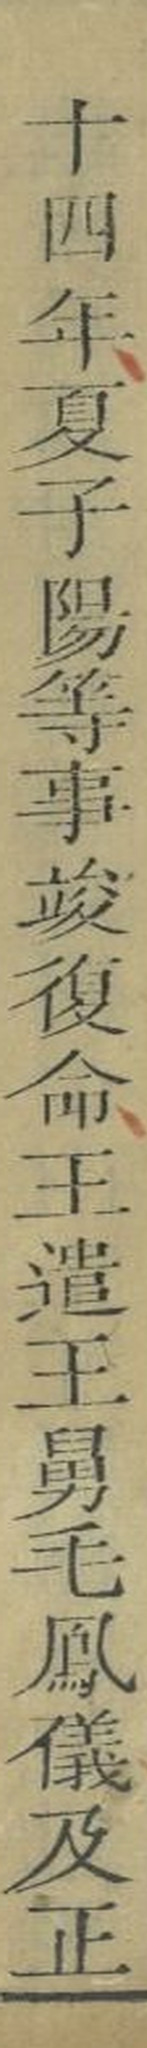十四年夏子陽等事竣復命王遣王舅毛鳳儀及正
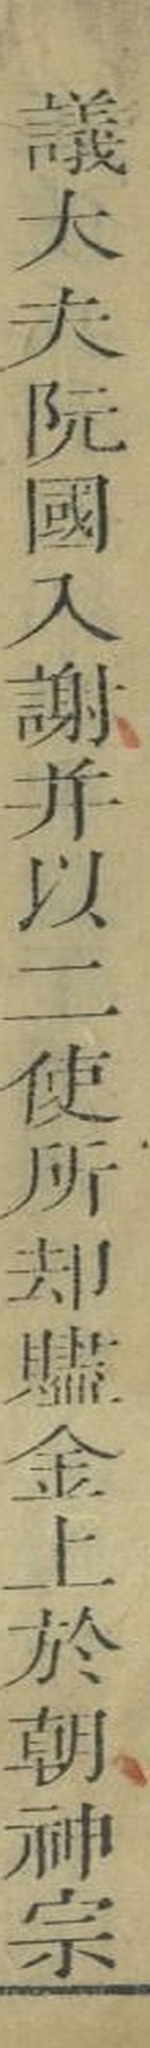議大夫阮国入謝并以二使所却贐金上於朝神宗
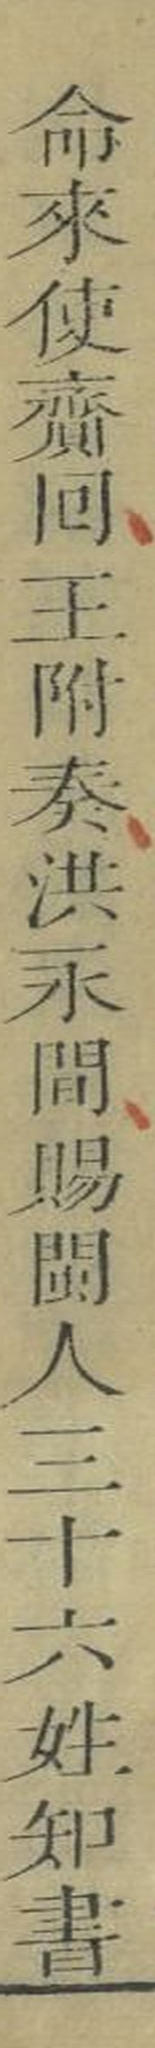命来使齎回王附奏洪永間賜閩人三十六姓知書
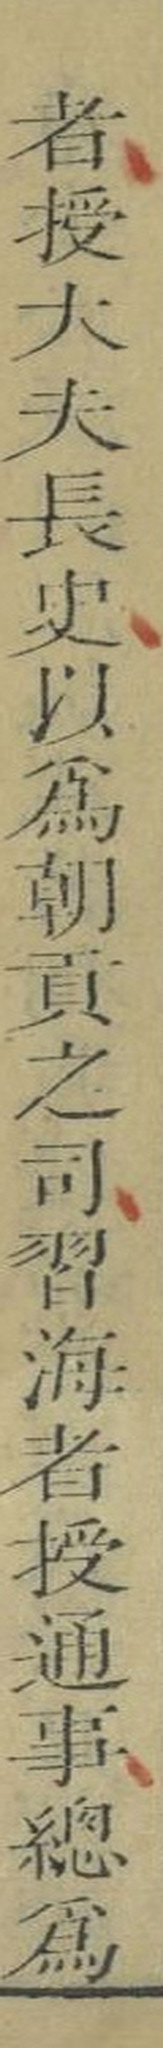者授大夫長史以為朝貢之司習海者授通事総為
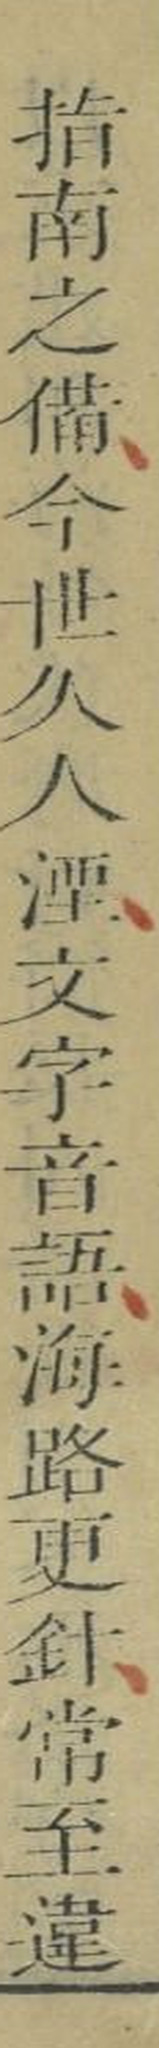指南之備今世久人湮文字音語海路更針常至違
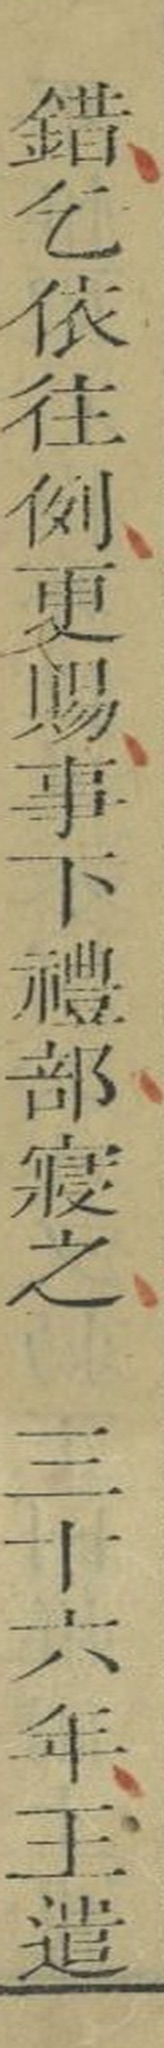錯乞依往例更賜事下礼部寝之三十六年王遣
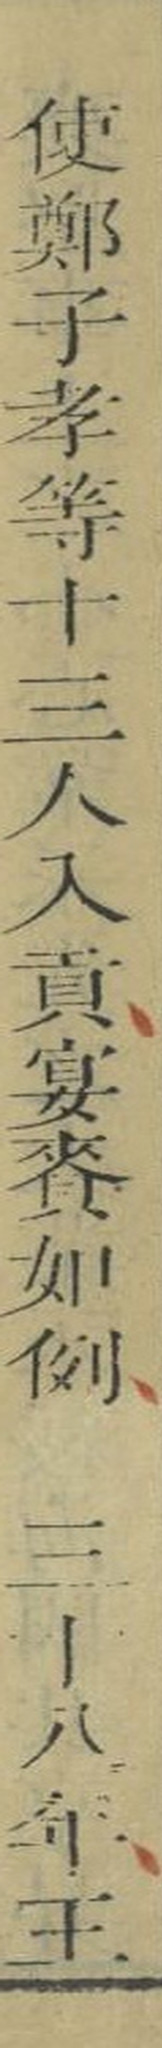使鄭子孝等十三人入貢宴賚如例三十八年王
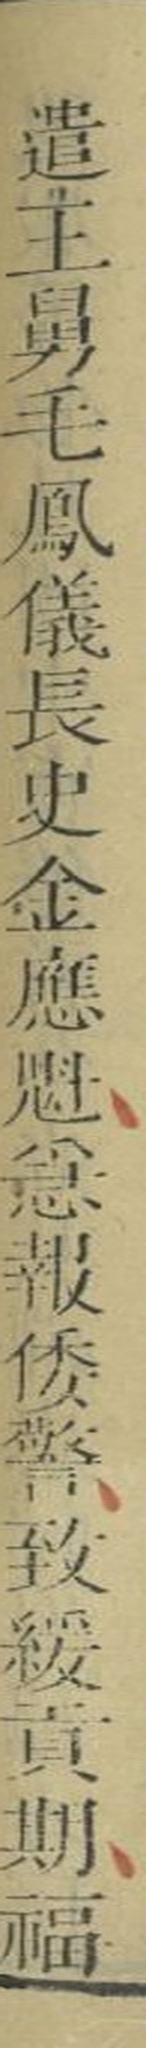遣王舅毛鳳儀長史金応魁急報倭警致緩貢期福
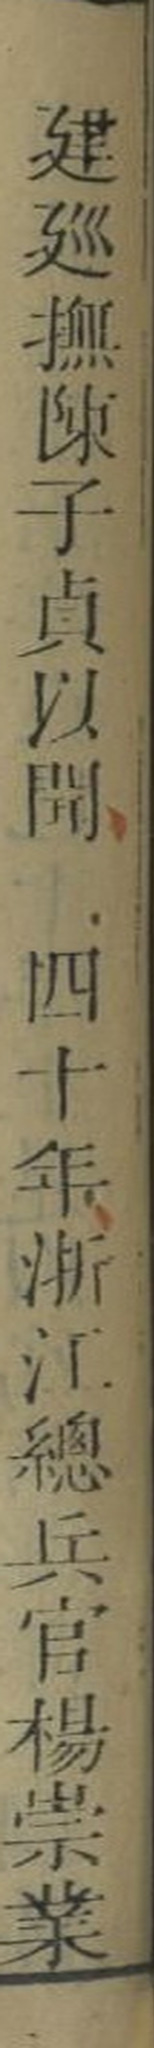建巡撫陳子貞以聞四十年浙江総兵官楊崇業
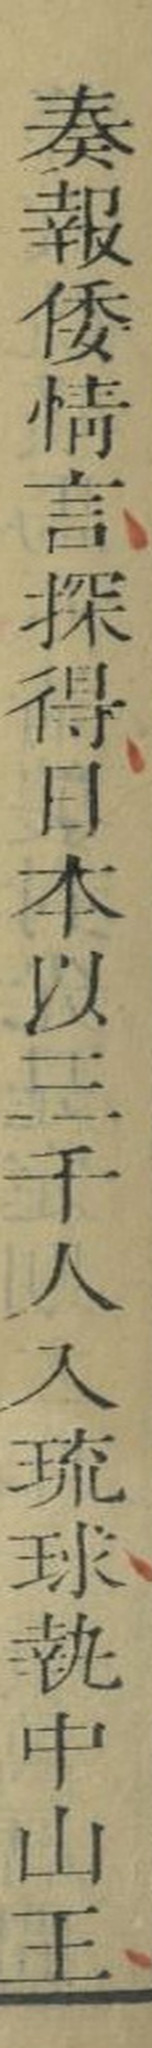奏報倭情言探得日本以三千人入琉球執中山王
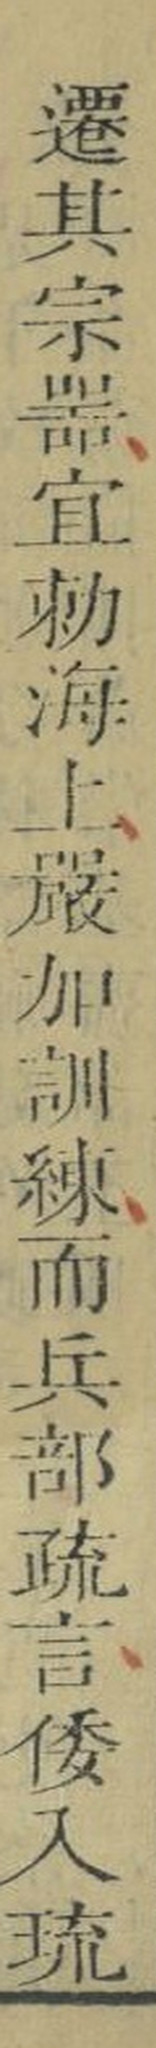遷其宗器宜勅海上厳加訓練而兵部疏言倭入琉
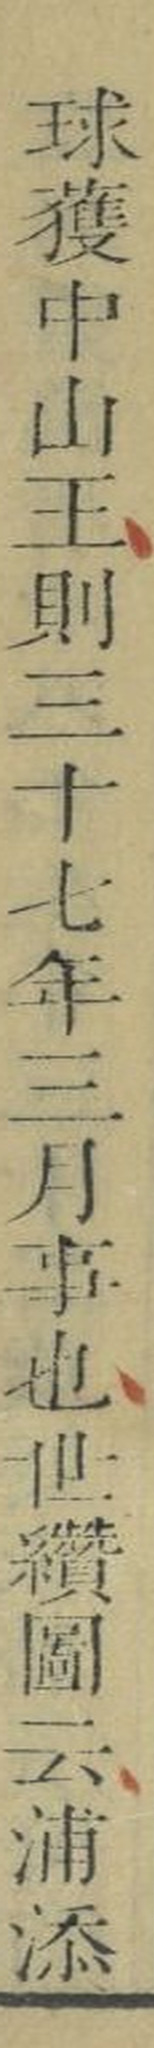球獲中山王則三十七年三月事也世纘図云浦添
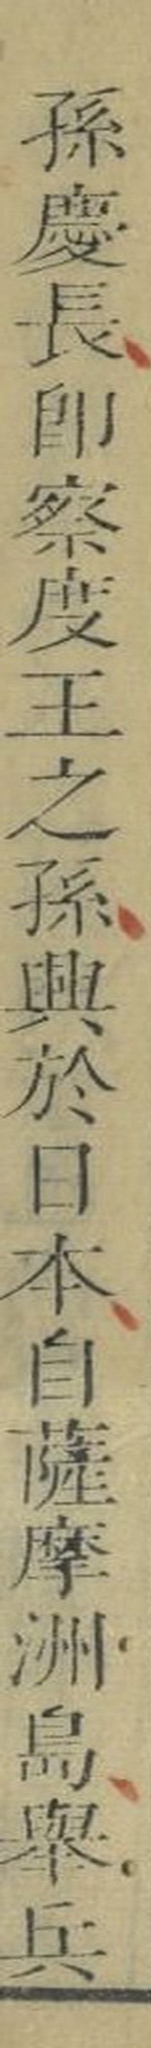孫慶長即察度王之孫興於日本自薩摩洲島挙兵
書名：中山伝信録 巻三
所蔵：University of the Ryukyus Library
